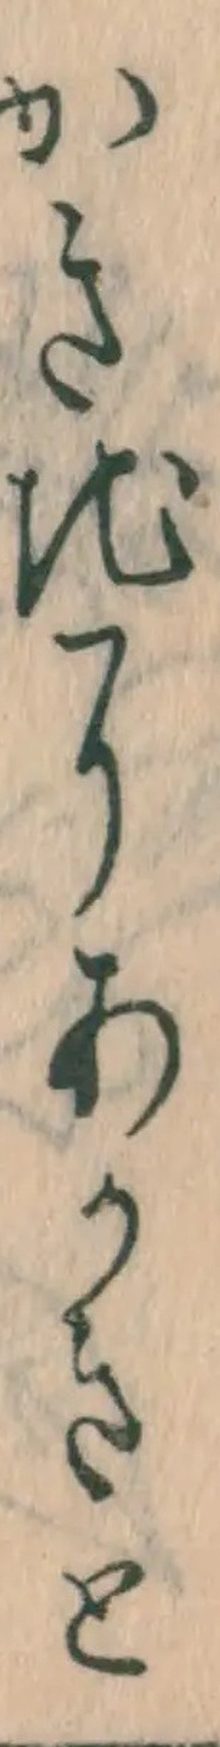かき地にあかきと
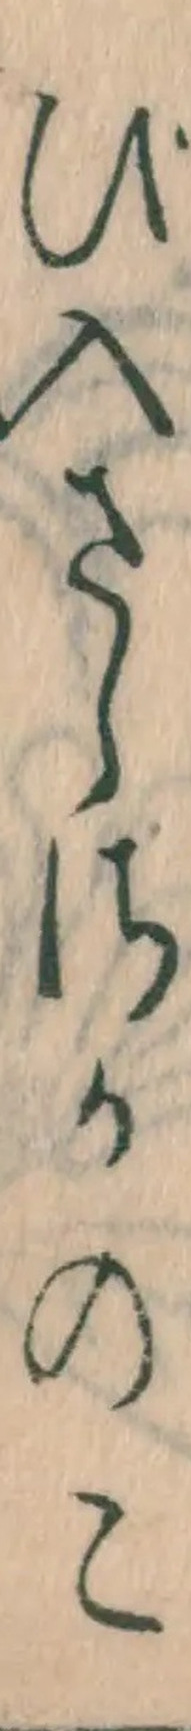び入さらさかのこ
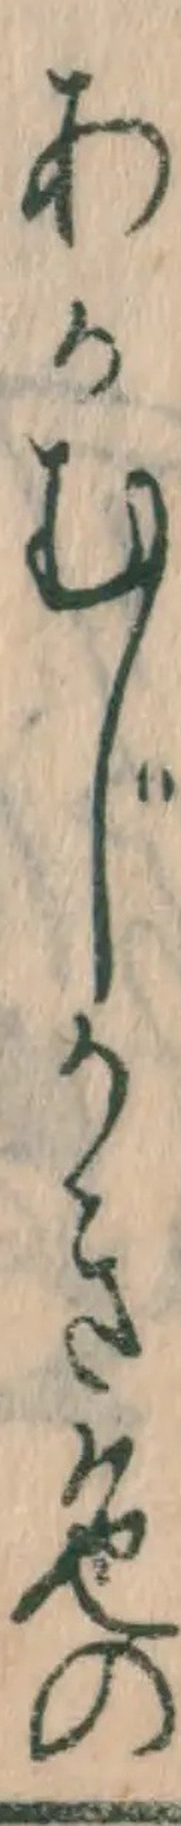あかむじかき色の
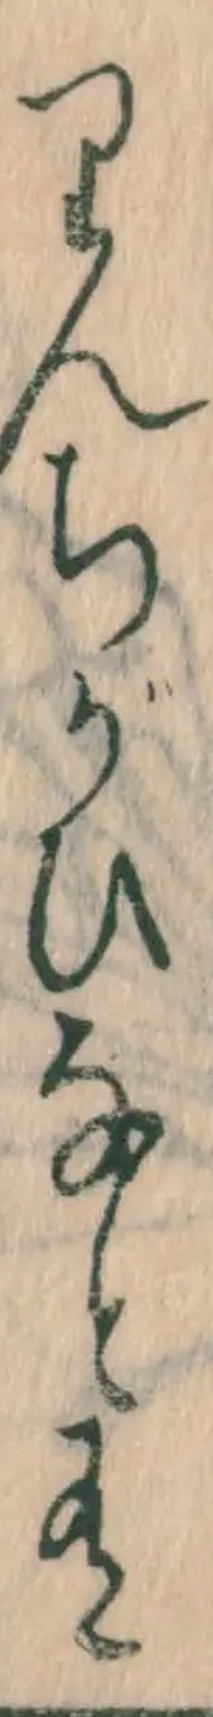りんちがひなと有
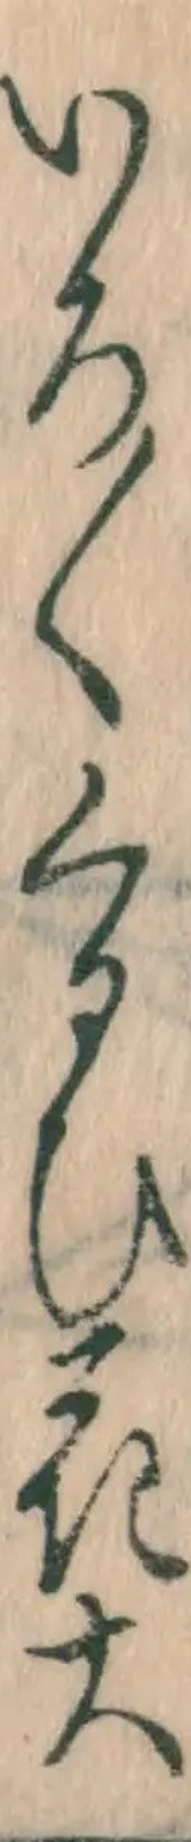いろ〳〵くるひ花大
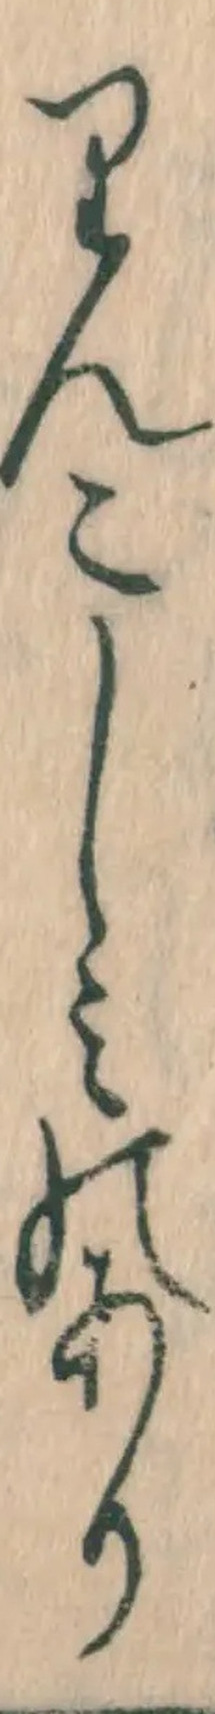りんこしみのあり

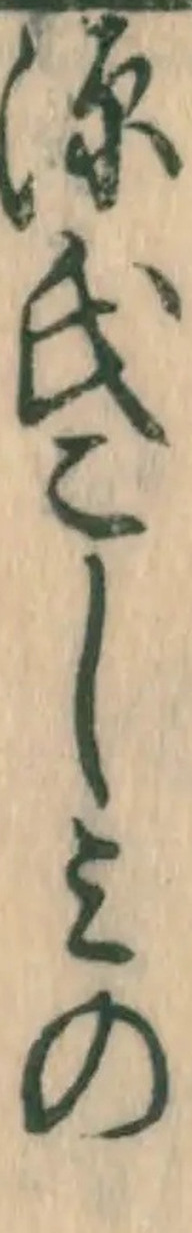●源氏こしみの
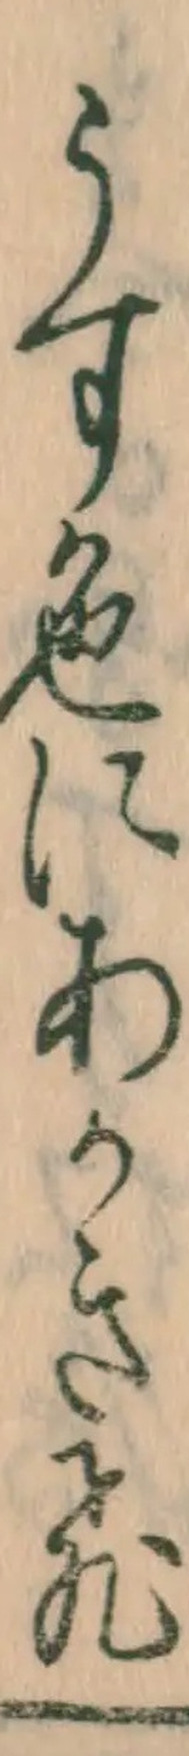うす色にあかき飛
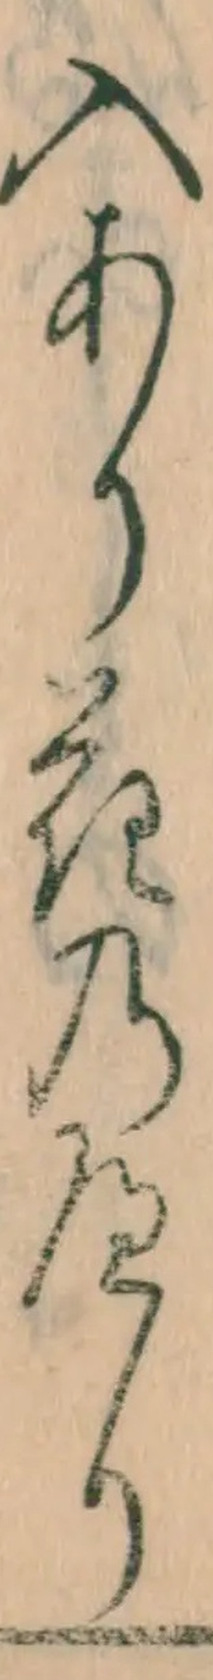入あり花のへり
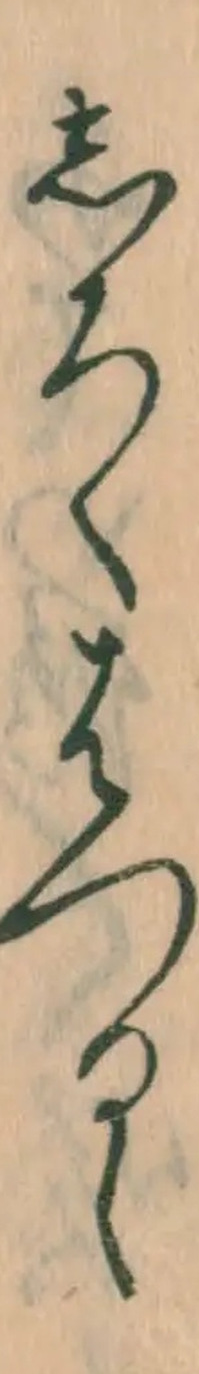しろくはつるゝ
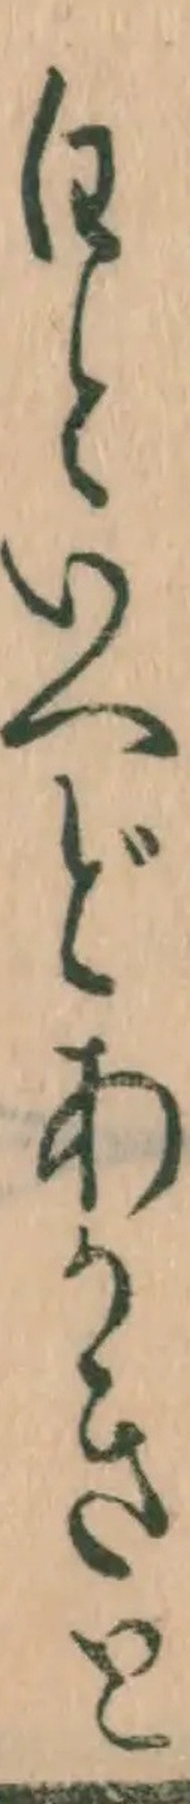白といへどあかきと
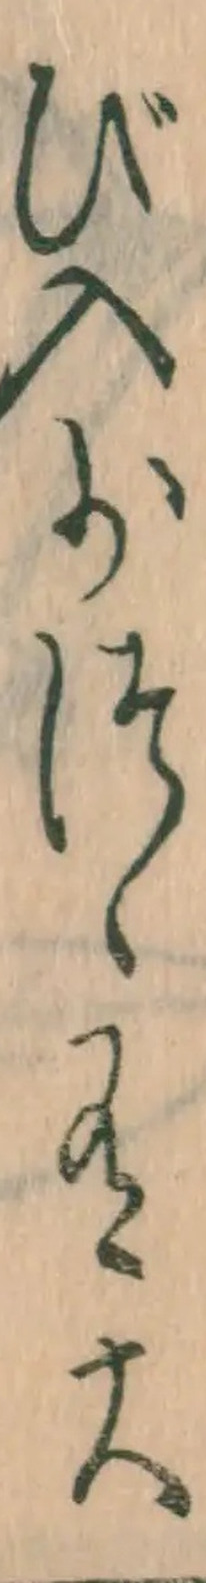び入少つゝ有大
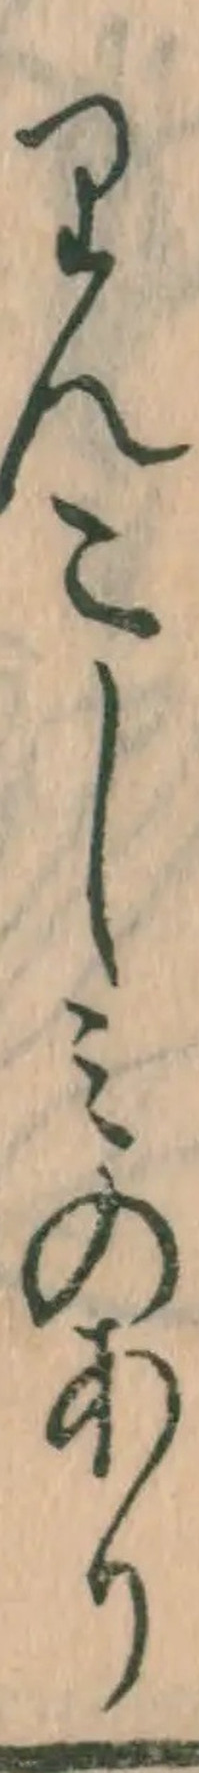りんこしみのあり
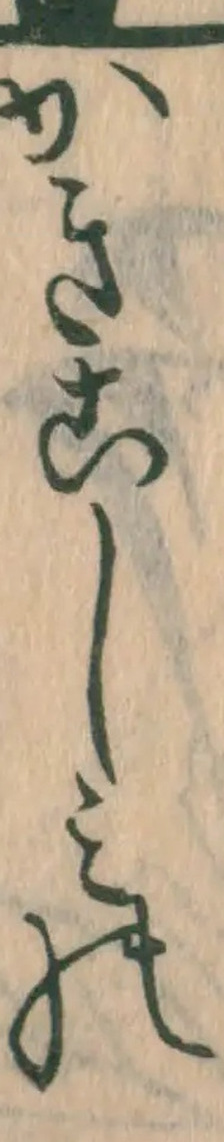●かきこしみの
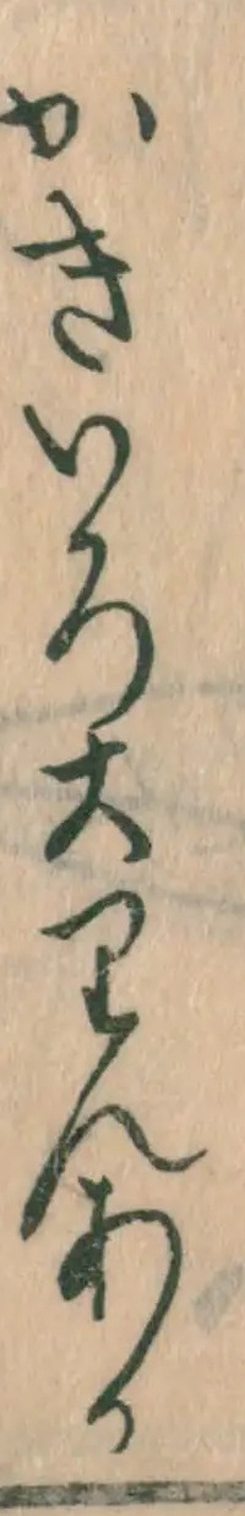かきいろ大りんあか
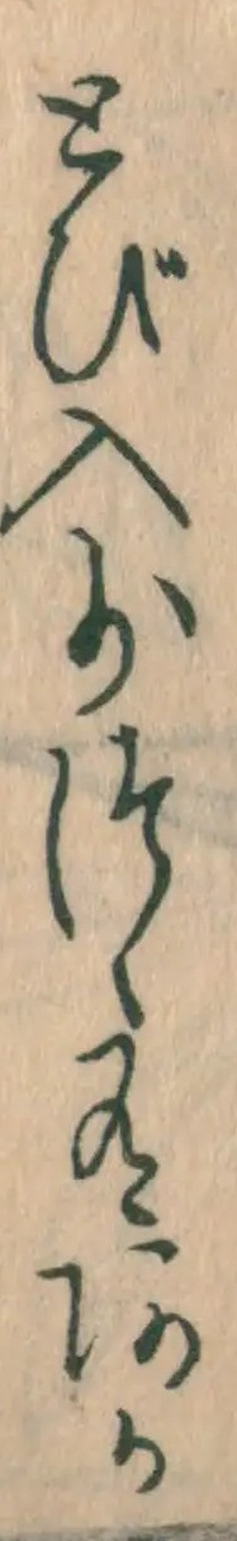とび入少つゝ有あか
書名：錦繍枕 5巻. [5]
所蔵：国立国会図書館 National Diet Library, JAPAN
